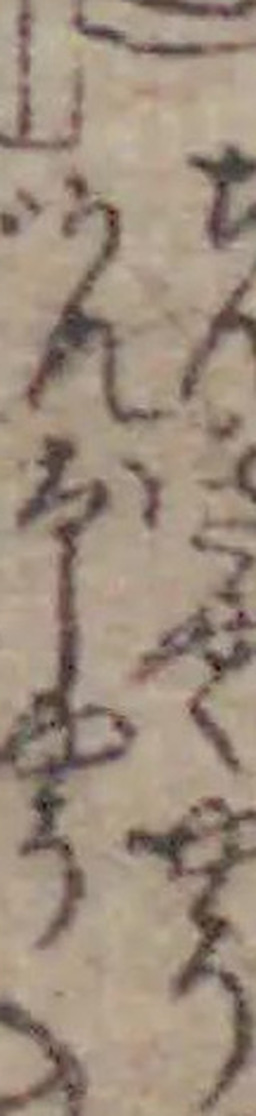かんおしやう
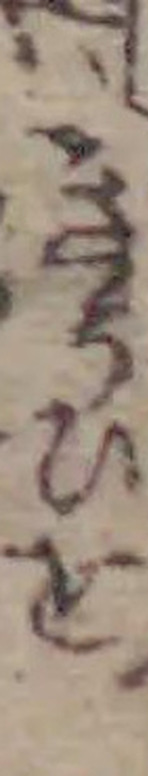ぎうひを
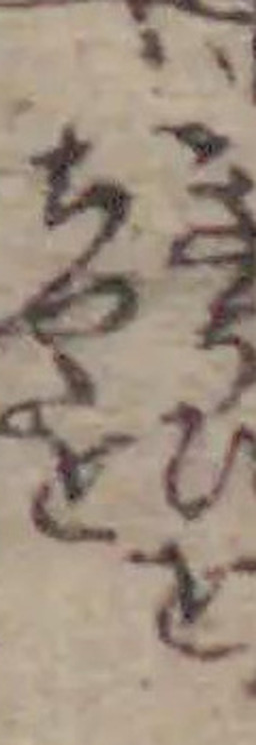ちやを
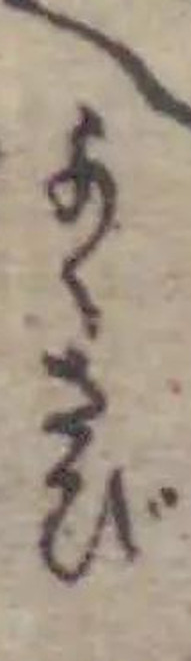よくさび
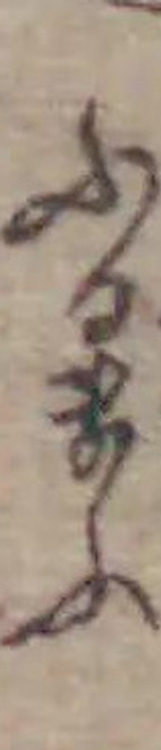ふるまふ
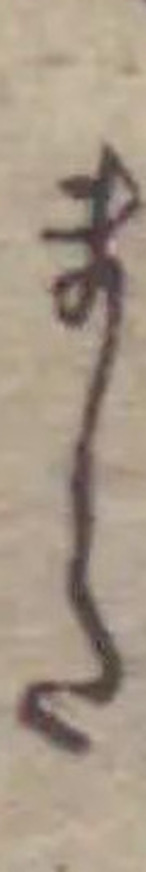ました
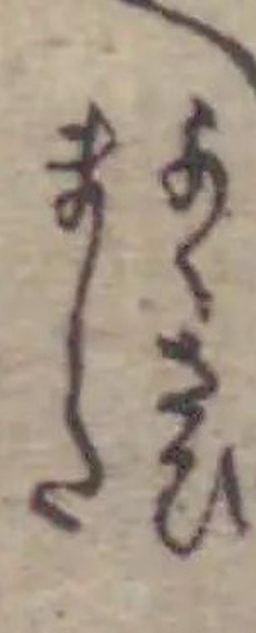ました
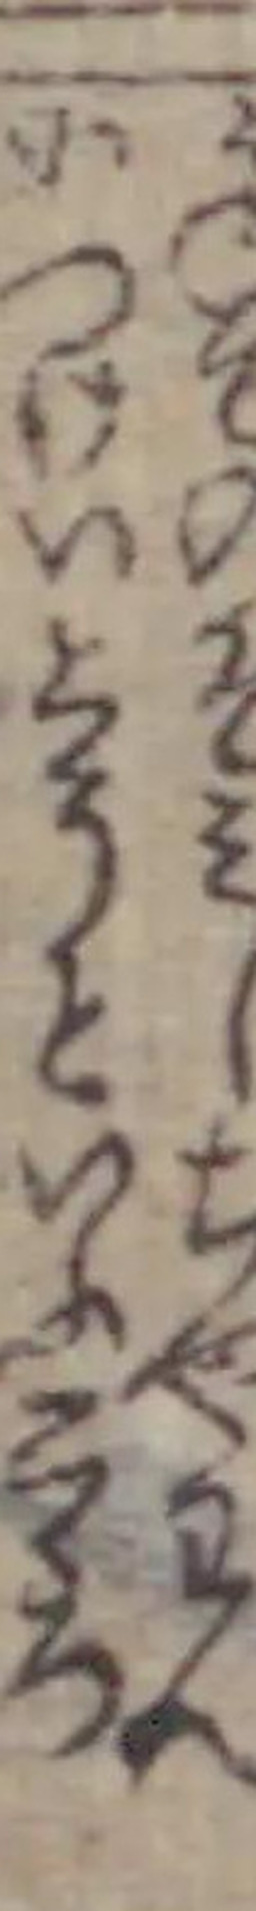につけいとうといふこゝろ
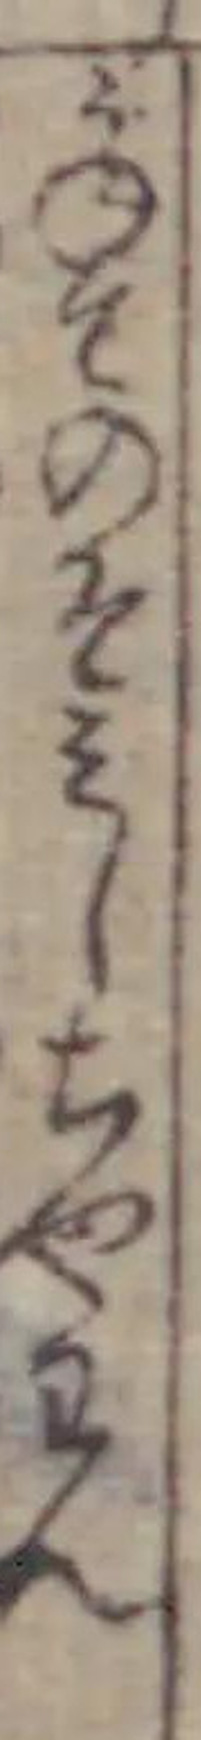かねてのそみしちやわん
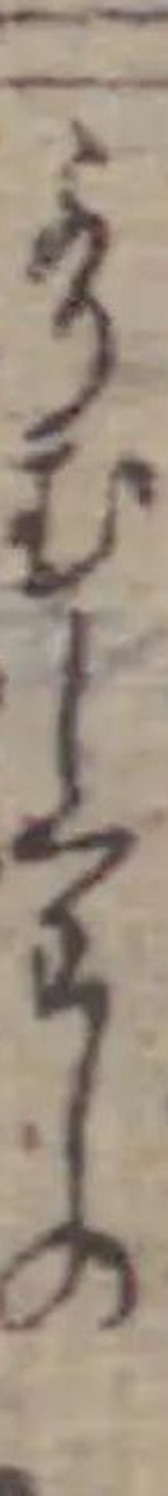よりむしくわしの
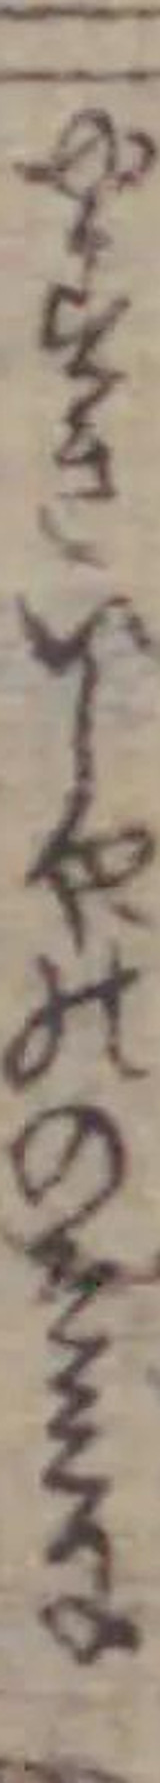やすきいしやののそみに
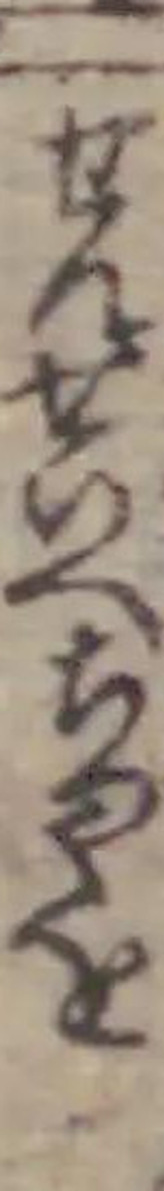せんせいへちやを
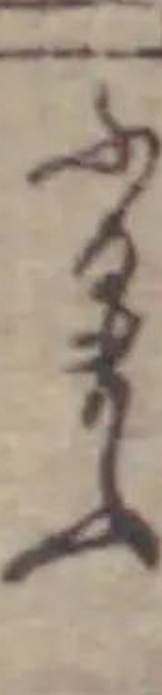ふるまふ
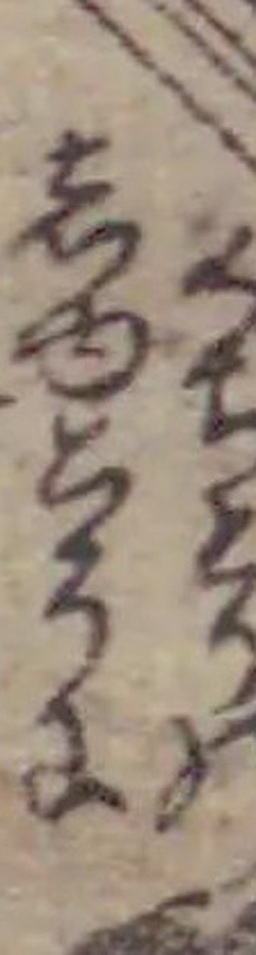しゆこうに
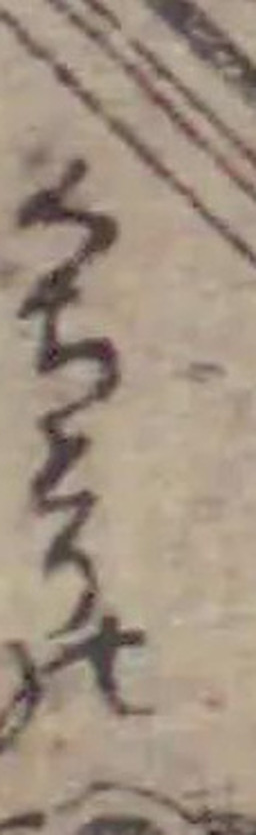くちとりの
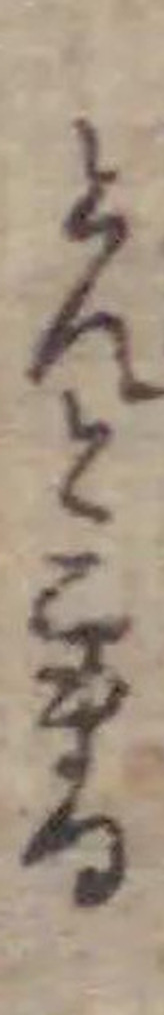とんとこまる
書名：名代干菓子山殿 3巻
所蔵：国立国会図書館 National Diet Library, JAPAN
